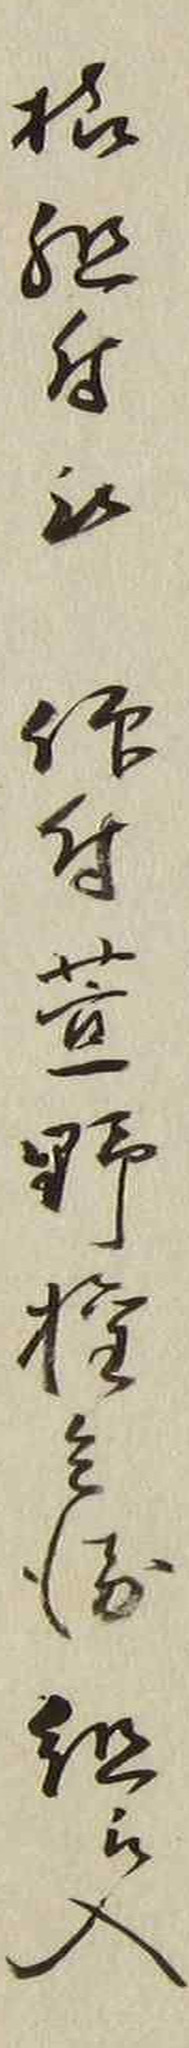様組付被仰付萱野権兵衛組江入
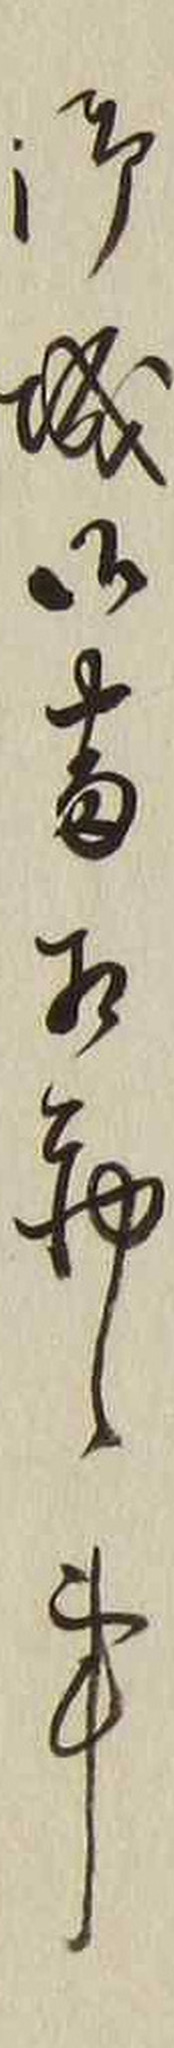御城御番相勤候事

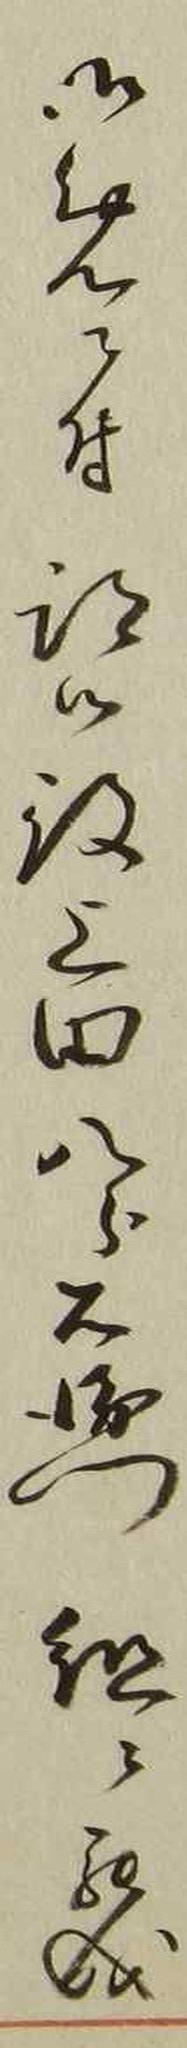御免ニ付跡御役上田八郎右衛門組ニ罷成
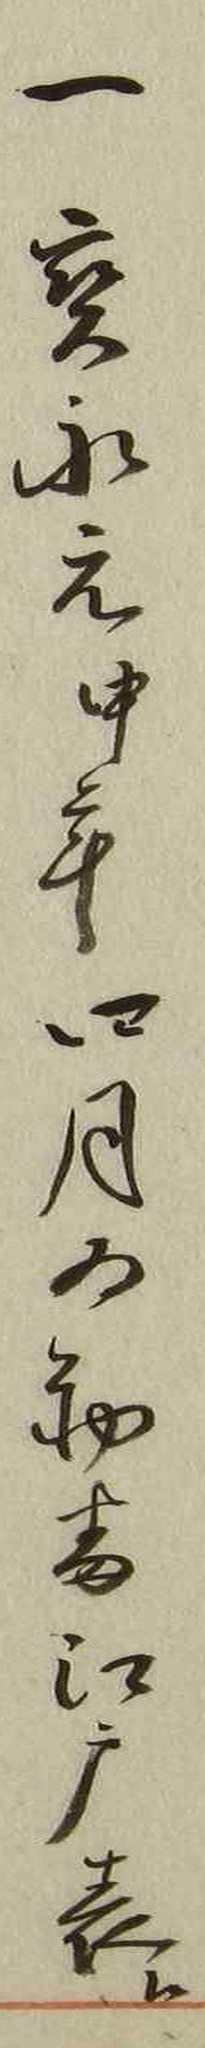一宝永元申年四月為勤番江戸表江
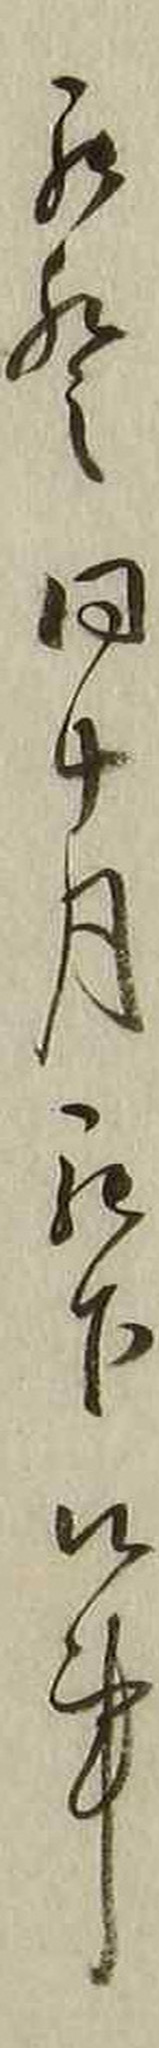罷登同十月罷下候事
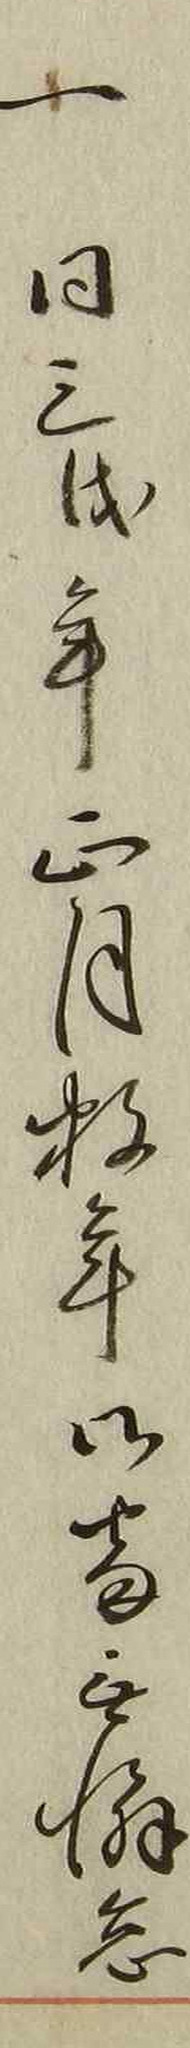一同三戌年正月数年御番無懈怠
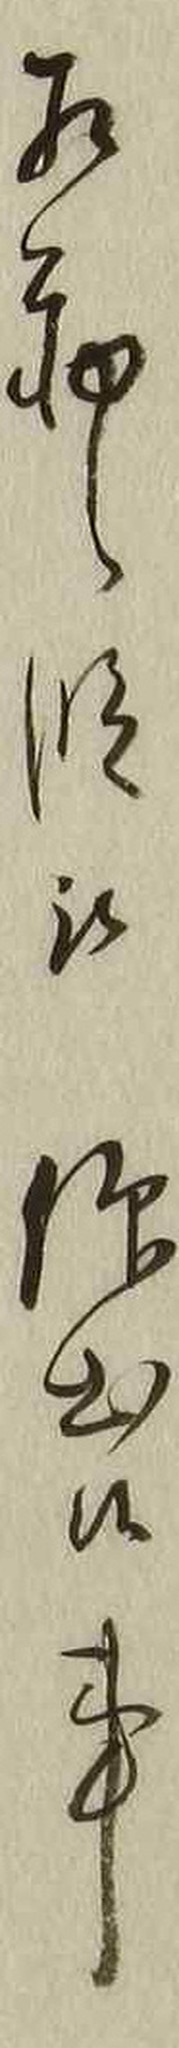相勤候段被仰出候事
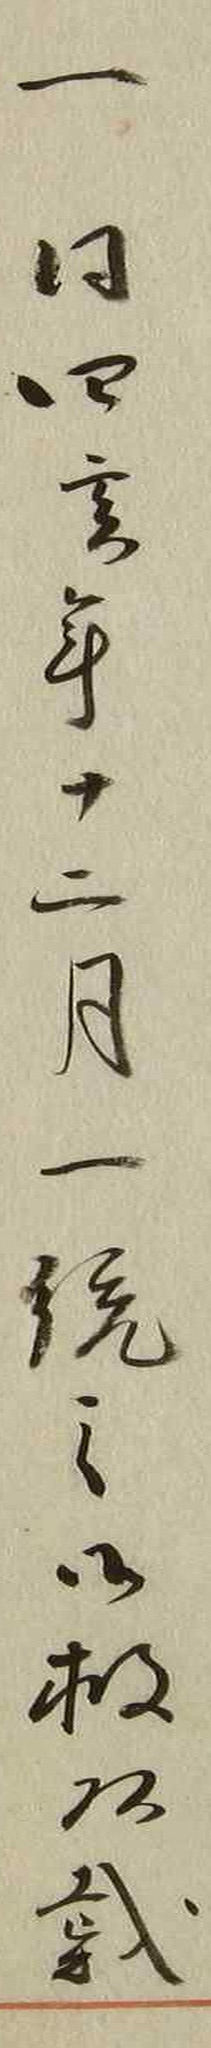一同四亥年十二月一統之御救頂戴
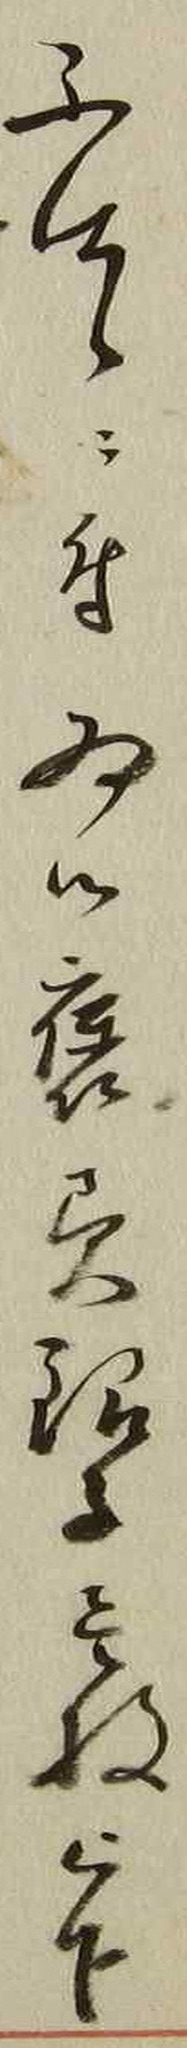不仕候ニ付為御褒美銀子壱枚被下
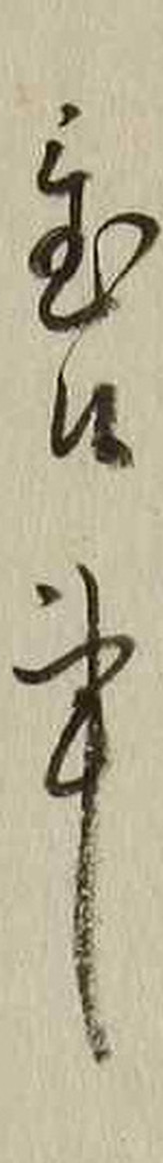置候事
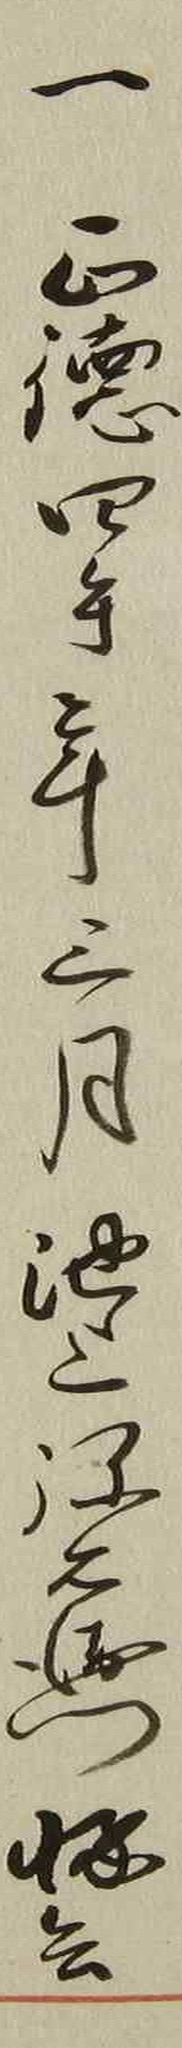一正徳四午年三月池上孫右衛門忰兵
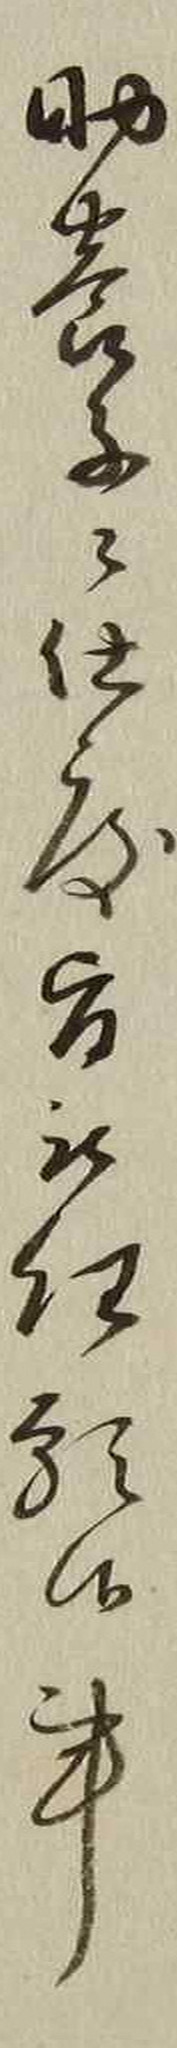助養子ニ仕度旨被任願候事
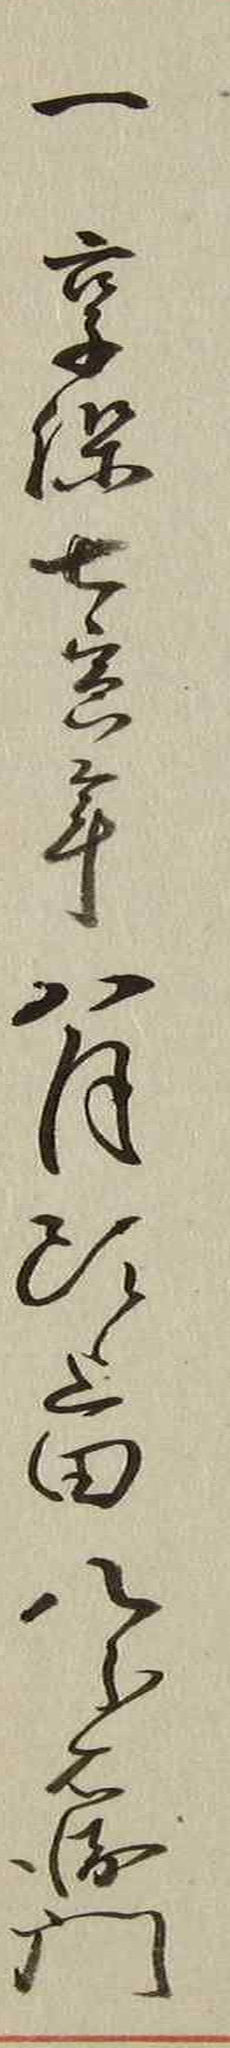一享保七寅年八月頭上田八郎右衛門
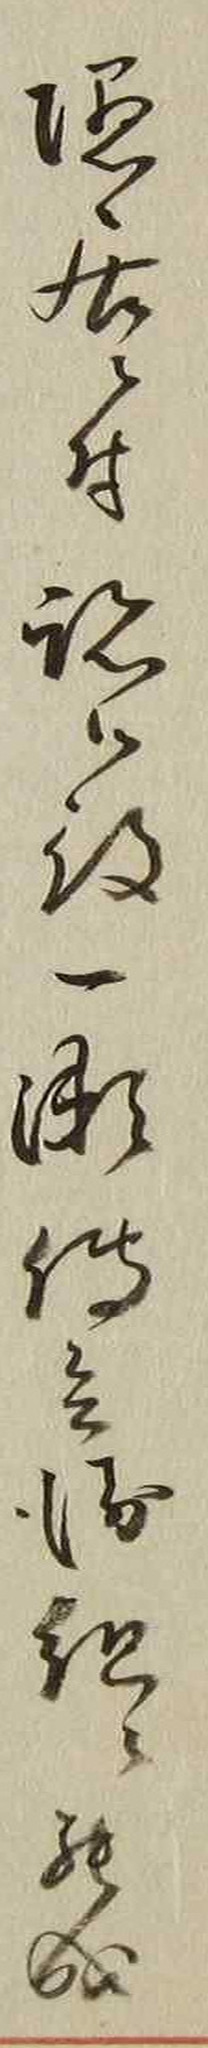隠居ニ付跡御役一瀬伝兵衛組ニ罷成
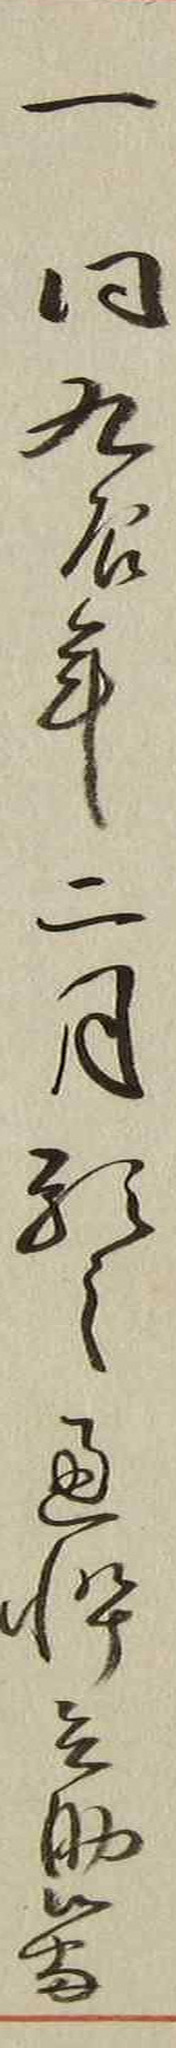一同九辰年二月願之通忰兵助御番
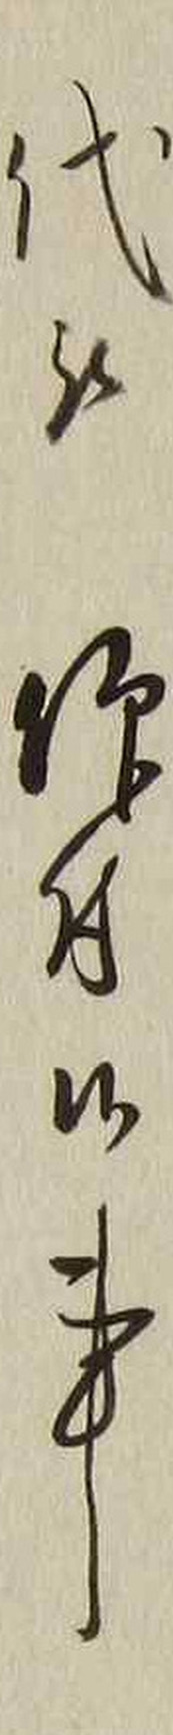代被仰付候事
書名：諸士系譜　巻之26　い之部26
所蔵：会津若松市立会津図書館
